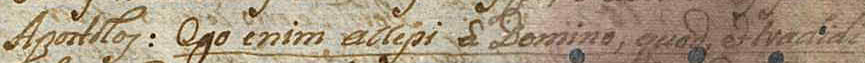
Apostolos: ego enim accepi e Domino, quod, et tradidi
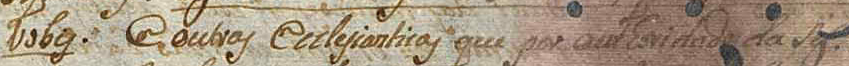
vobis. E outras Ecclesiasticas que por authoridade da Ig.
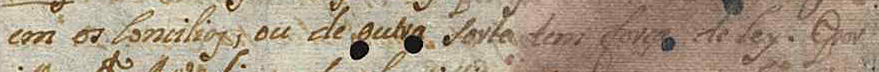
em os Concilios, ou de outra sorte tem força de Ley. E por
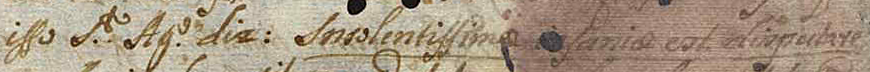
isso s.to Ag.o diz: Insolentissimæ _saniæ est disputare
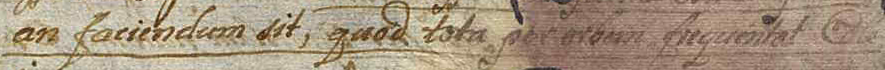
an faciendum sit, quod tota per orbem frequentat Ecle
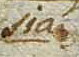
sia
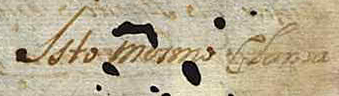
Isto mesmo Chama
